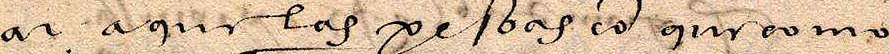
ar aquelas pesoas cō que como
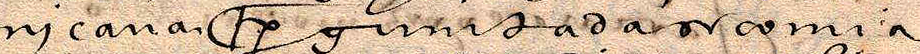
njcaua / ꝑgumtada se comia
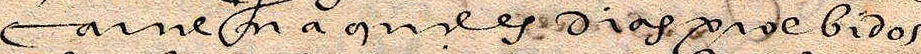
carne naqueles dias proebidos
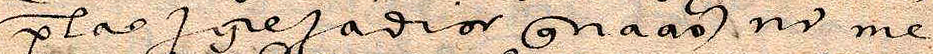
p̄la JgreJa dise q̄ naaõ nē me
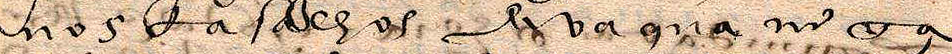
nos tasalhos de vaqua nē ga
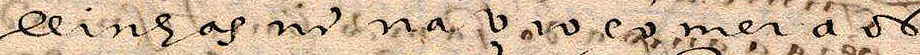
llinhas nē na vio comer aos
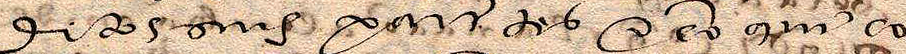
ditos seus parētes e c̄o quē co
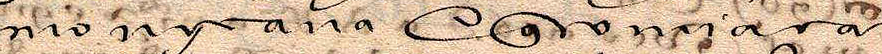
monycaua e q̄ comia car
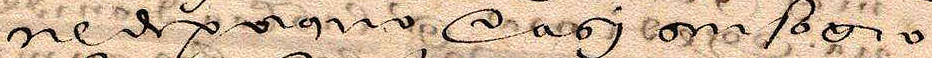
ne de porquo e asy seu sogro
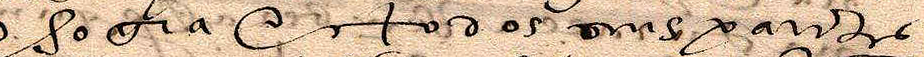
e sogra e todos seus parētes
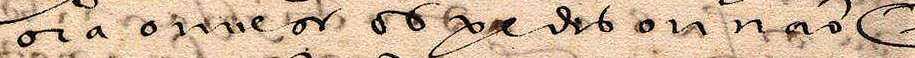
ora ouuese ospedes ou naõ E
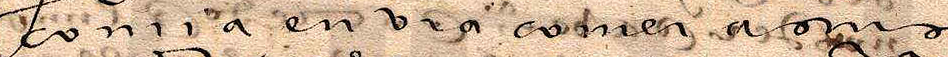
comia eu via comer a seus
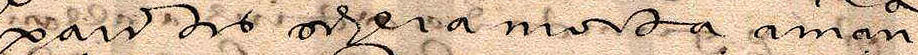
parētes se hera morta a manra
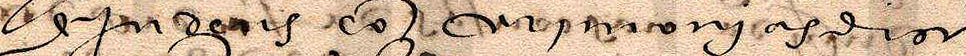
de Judeus cō cerjmonjas dise
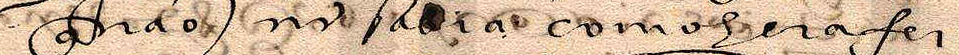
q̄ naõ nē sabia como hera fei
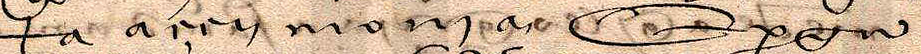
ta a çerimonja E ꝑgū
